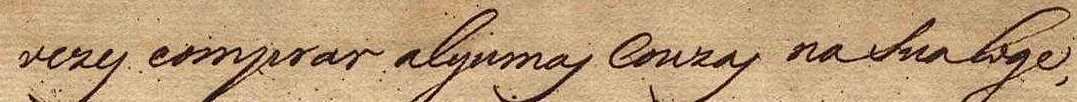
vezes comprar algumas couzas na Sua loge,
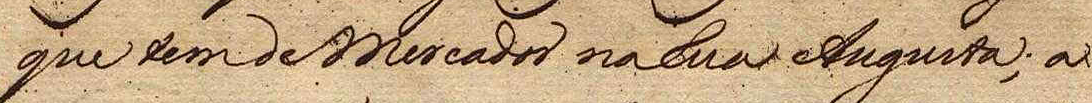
que tem de mercador na Rua Augusta; a
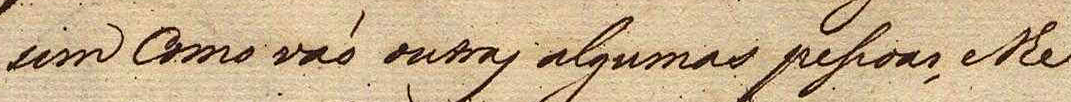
sim Como vaõ outras algumas pessoas, e lhe
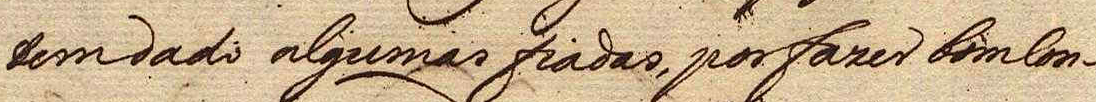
tem dado algumas fiadas, por fazer bom Con
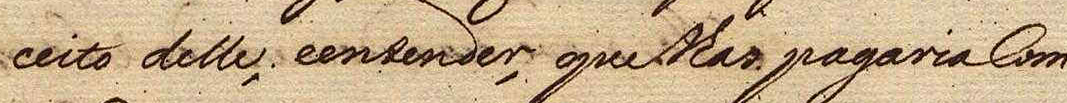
ceito delle, e entender, que lhas pagaria Com
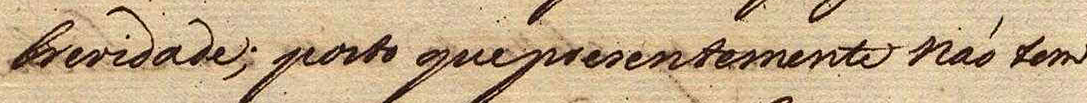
brevidade; posto que presentemente naõ tem
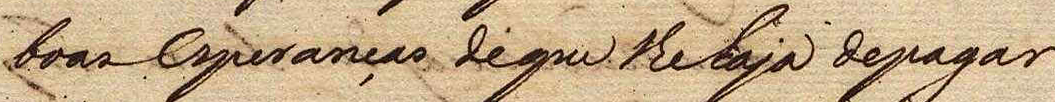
boas esperanças de que lhe haja de pagar
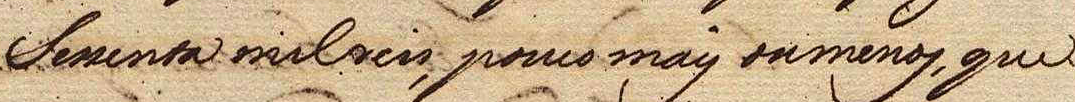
Sessenta mil reis, pouco mais ou menos, que
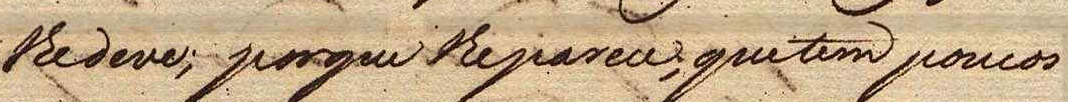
lhe deve; porque lhe parece, que tem poucos
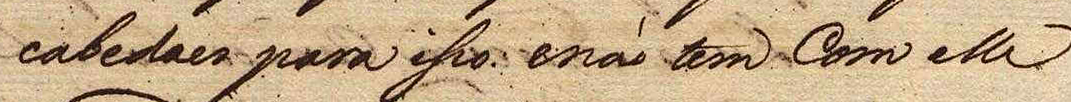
cabedaes para isso e naõ tem Com elle
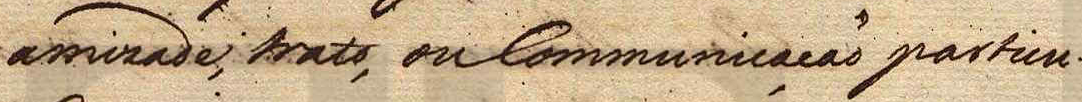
amizade, trato, ou Communicaçaõ particu
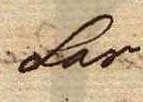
Lar
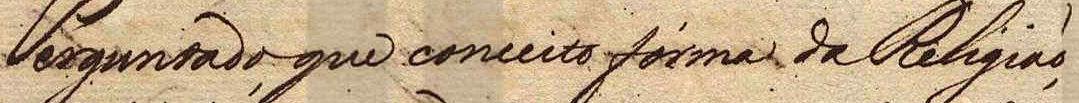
Perguntado, que conceito forma da Religiaõ,
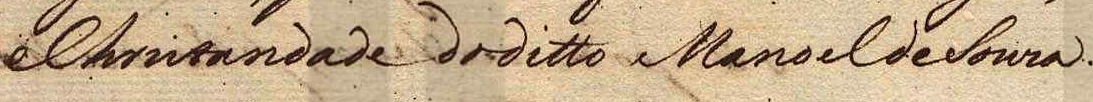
e Christandade do ditto Manoel de Souza?
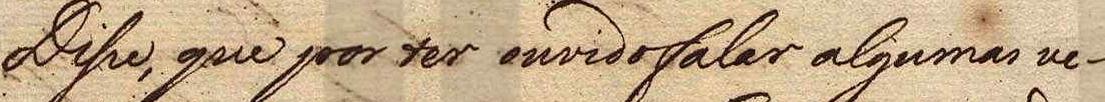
Disse, que por ter ouvido falar algumas ve
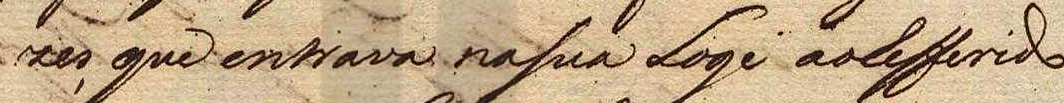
zes, que entrava na sua Loge ao Refferido
